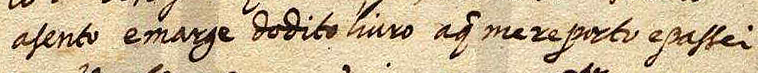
asento e marge do dito liuro a q̄ me reporto e passei
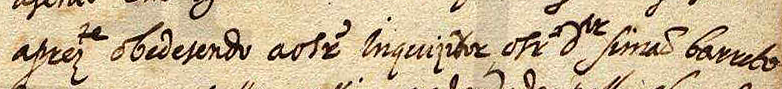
a prezte obedesendo ao sr̄ Inquizidor, o sr dtor Simaõ barreto
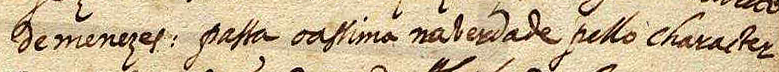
de menezes: passa o assima na verdade pello character
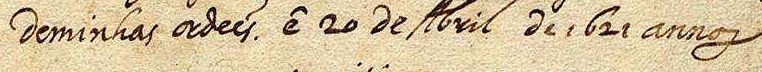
de minhas ordeēs. ē 20 de Abril de 1621 annos
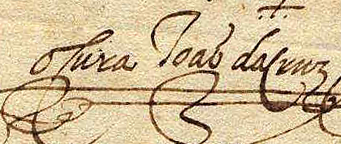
o Cura Ioaõ da Cruz
